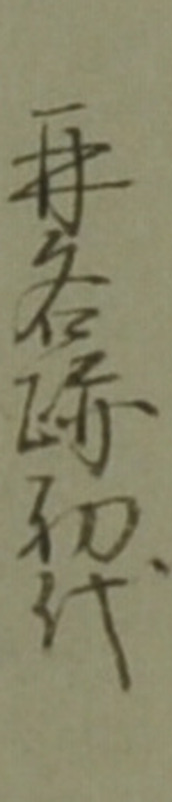再名跡初代
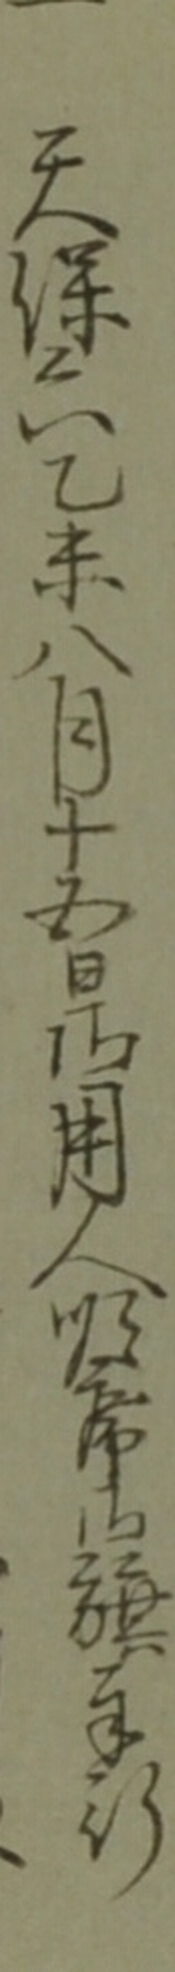一天保六乙未八月十五日御用人順席御旗奉行
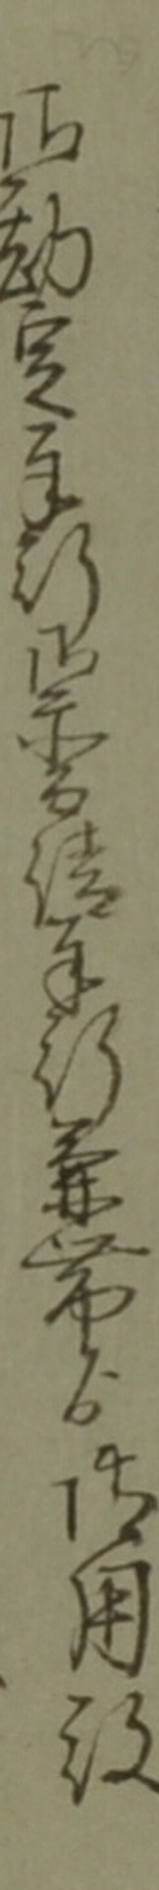御勘定奉行御普請奉行兼帯ゟ御用役
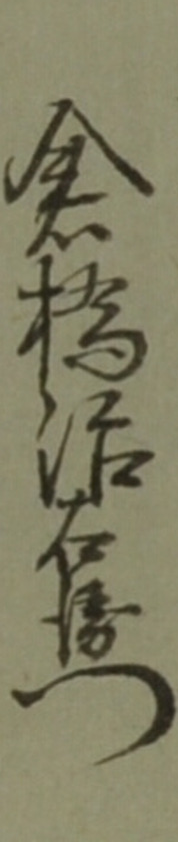倉橋治右衛門
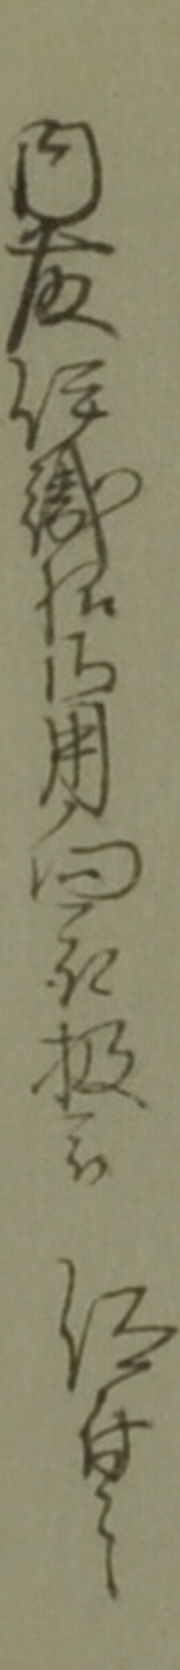内藤伊織様御用向取扱被仰付之
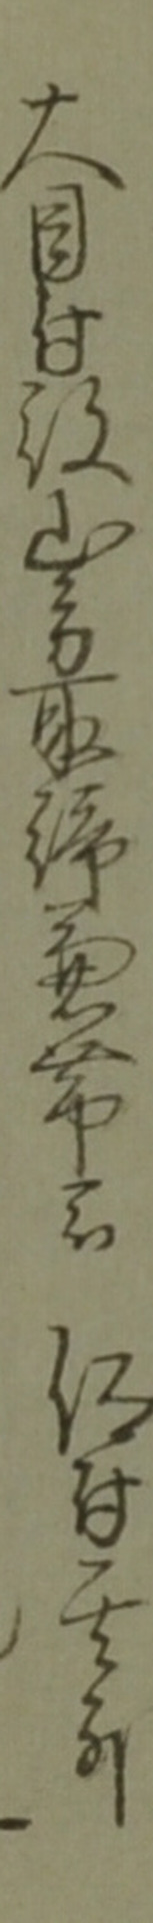大目付役山方取締兼帯被仰付其外
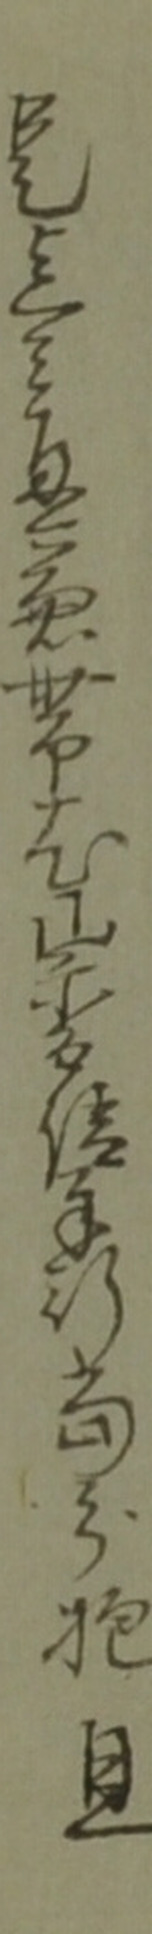是迄之通兼帯尤御普請奉行当分抱且
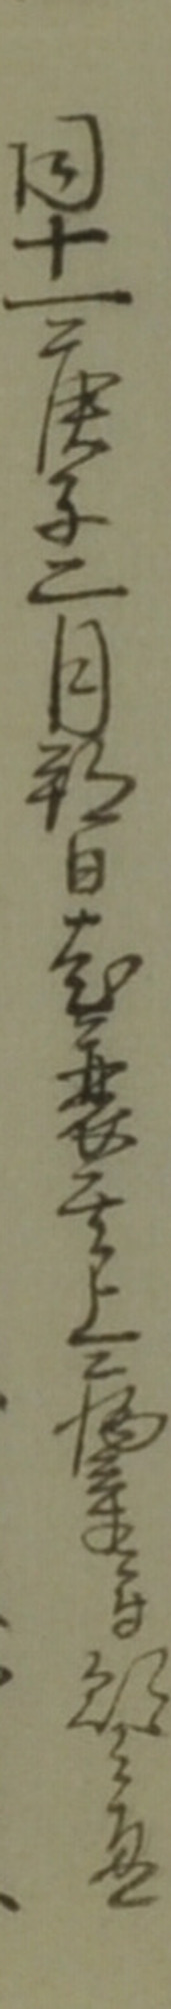一同十一庚子二月朔日老衰其上病気ニ付願之通
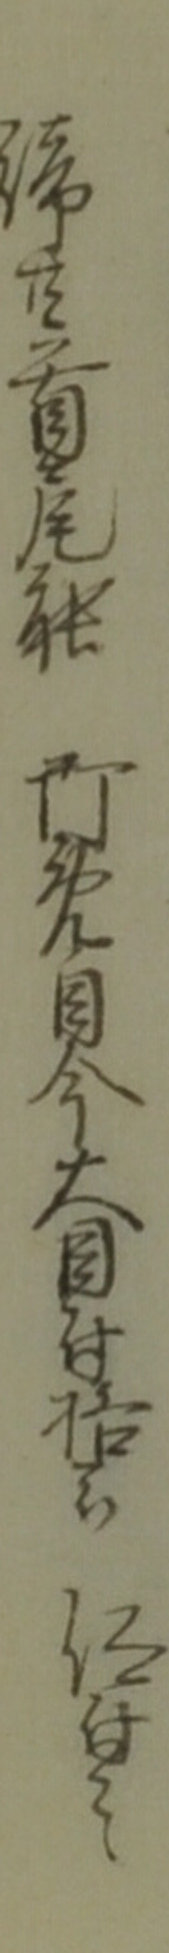締共首尾能御免自今大目付格被仰付之
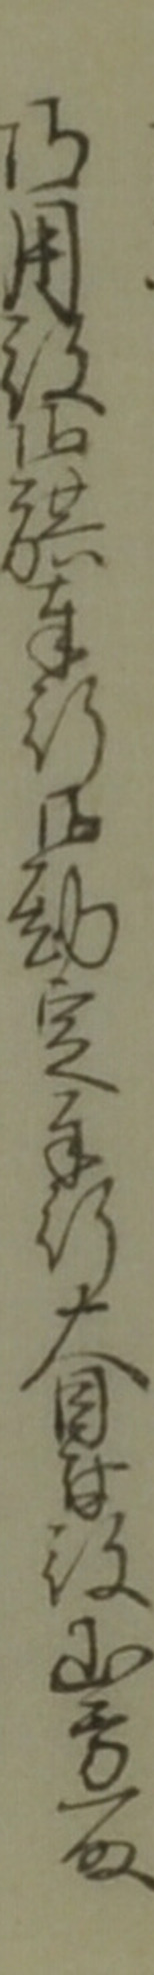御用役御旗奉行御勘定奉行大目付役山方取
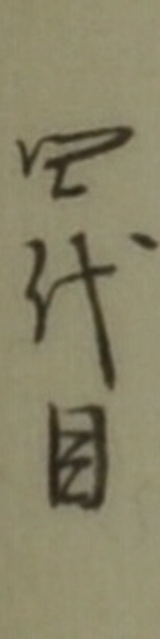四代目
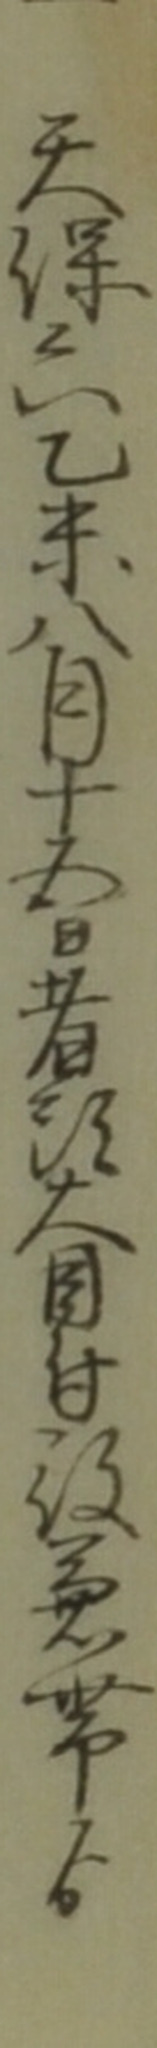一天保六乙未八月十五日者頭大目付役兼帯ゟ
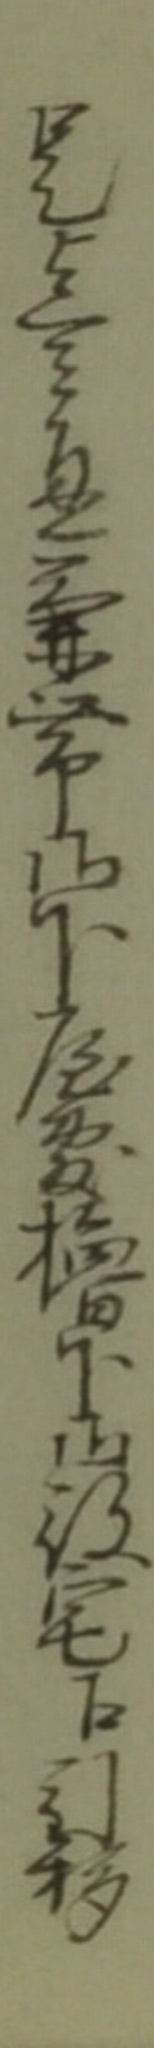是迄之通兼帯御下屋敷櫓下御役宅江引移
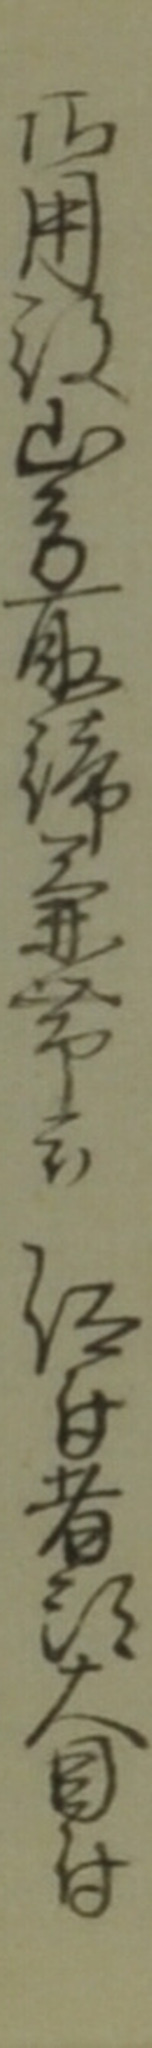御用役山方取締兼帯被仰付者頭大目付
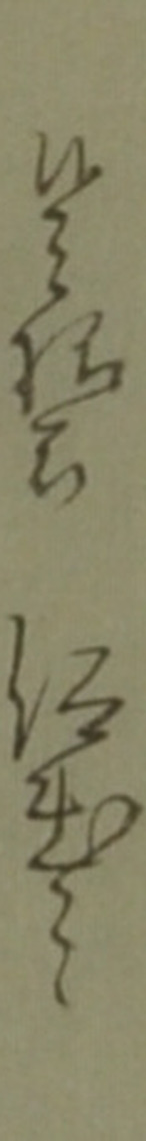候之様被仰出之
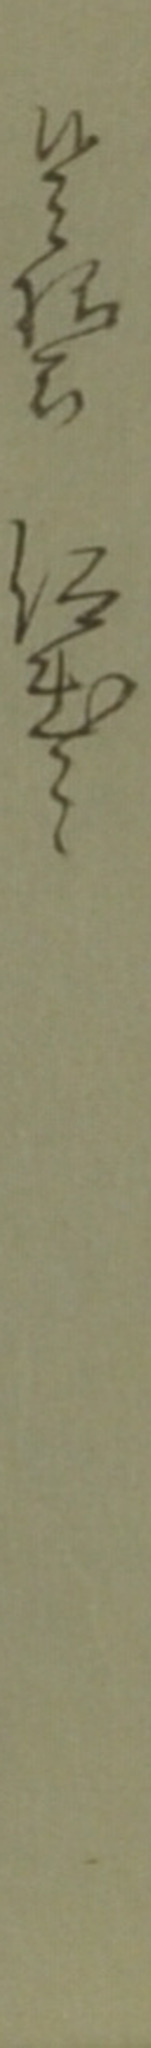候之様被仰出之
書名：諸御役代々録（三）
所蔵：伊那市立高遠町図書館・合同会社AMANE
